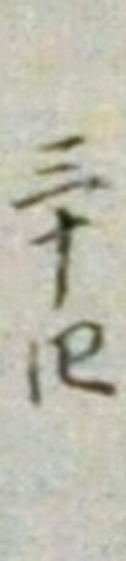三十四
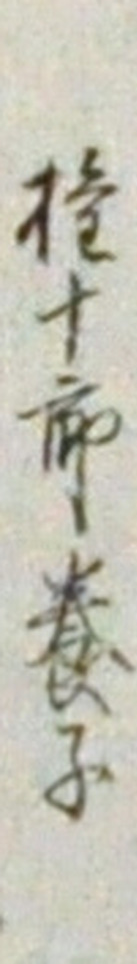権十郎養子
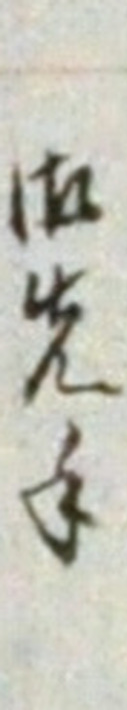御先手
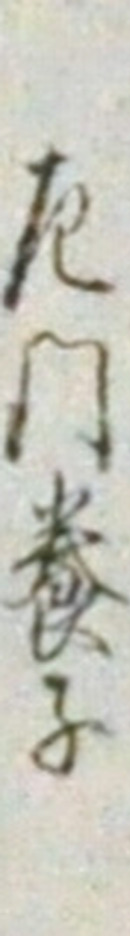左門養子
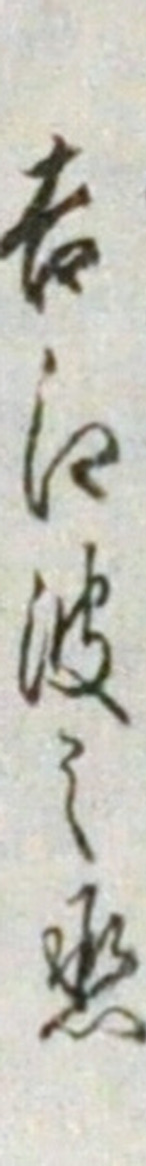吉江波之丞
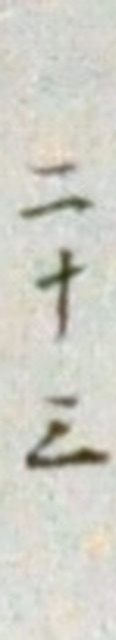二十三
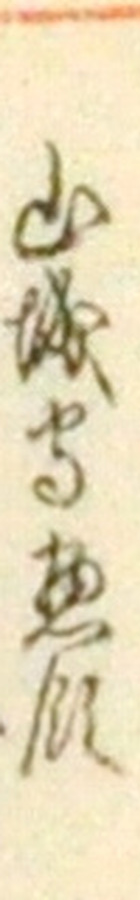山城守惣領
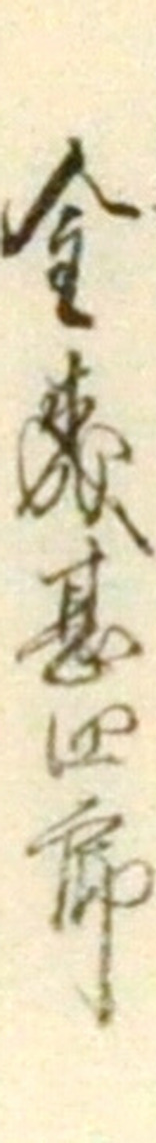金森甚四郎

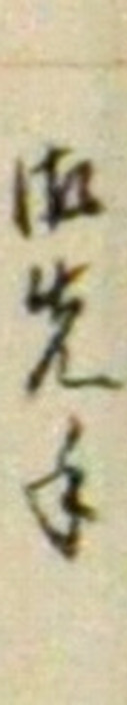御先手
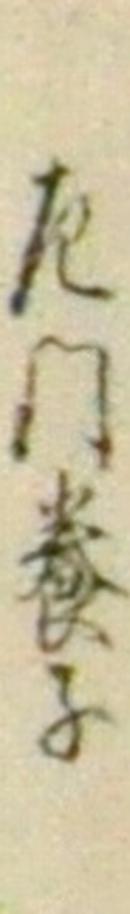左門養子
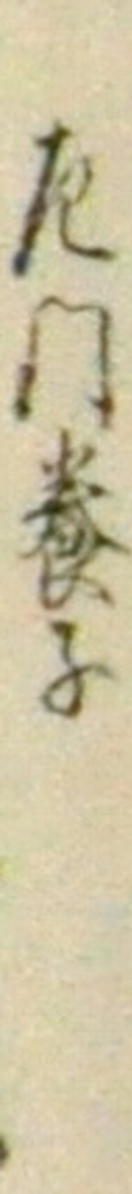左門養子
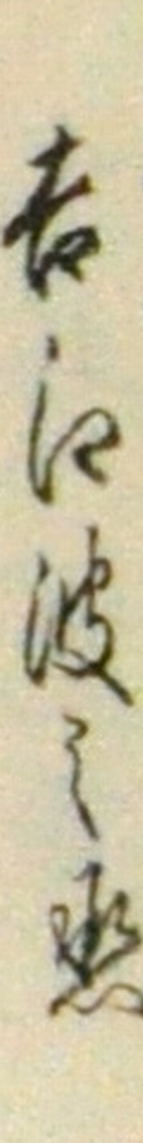吉江波之丞
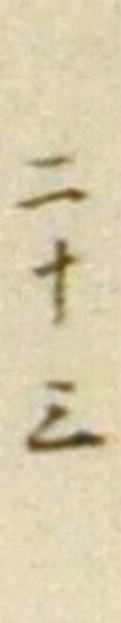二十三
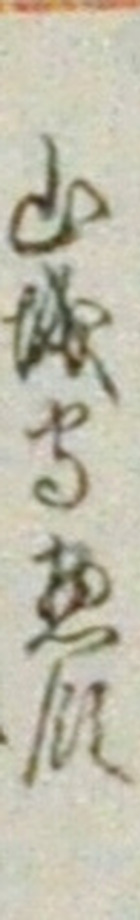山城守惣領
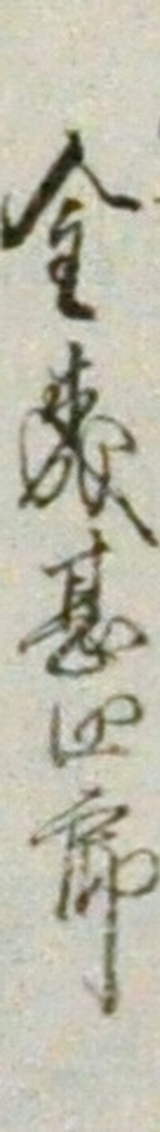金森甚四郎
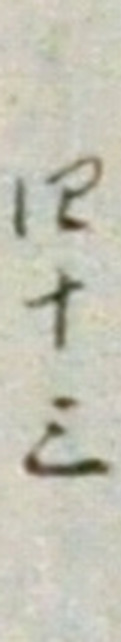四十三
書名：若年寄御役中之御書物〔一括〕
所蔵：伊那市立高遠町図書館・合同会社AMANE
